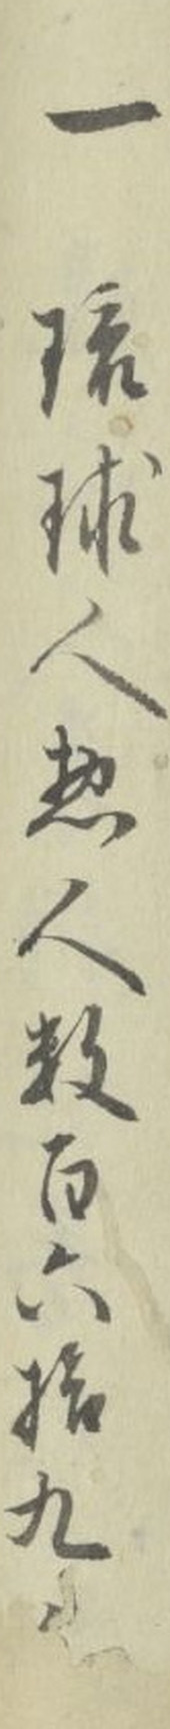一琉球人惣人数百六拾九
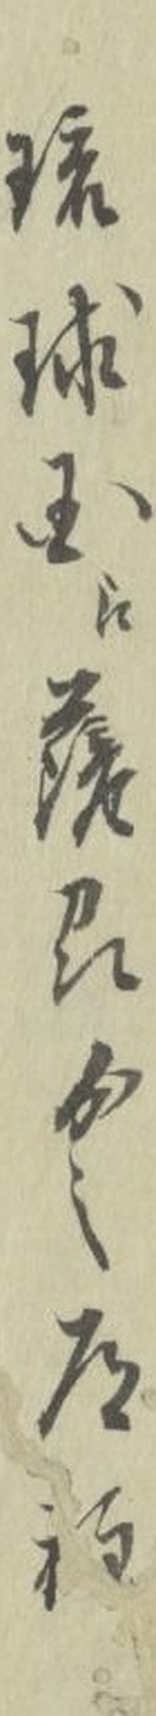琉球国え薩州ゟ之道程
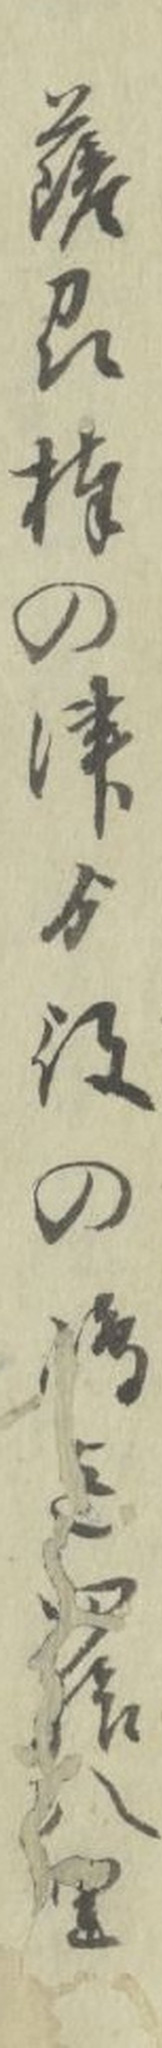薩州棒の津ゟ役の島迄四拾八里

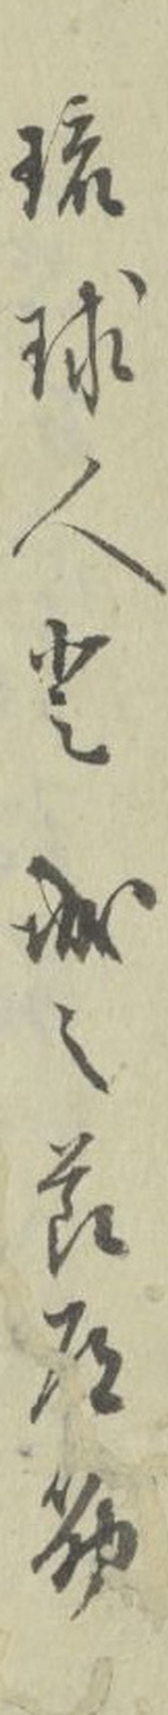琉球人登城之道筋
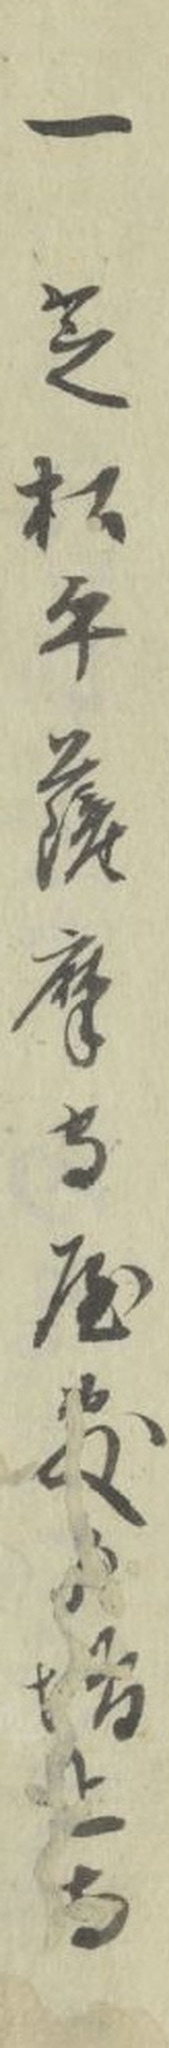一芝松平薩摩守屋敷ゟ増上寺
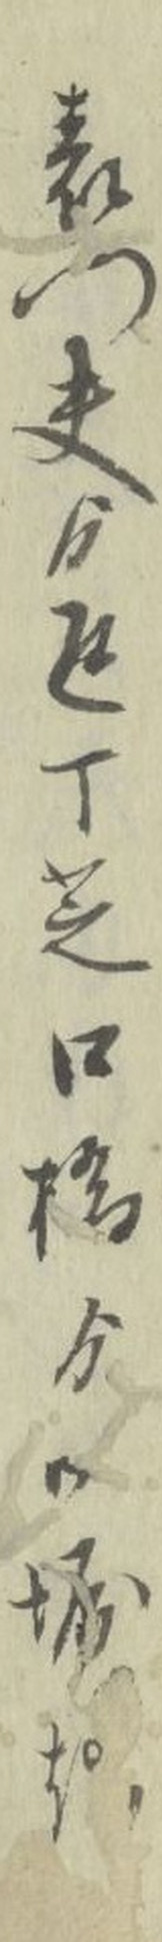表門夫ゟ通丁芝口橋ゟ御堀端
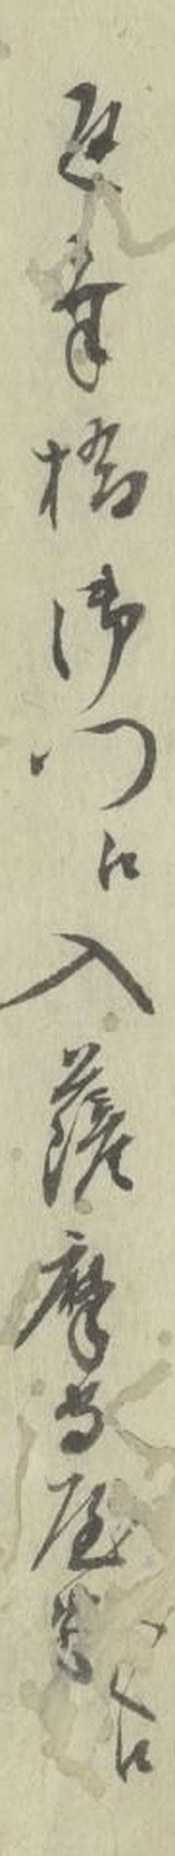通幸橋御門え入薩摩守屋敷え
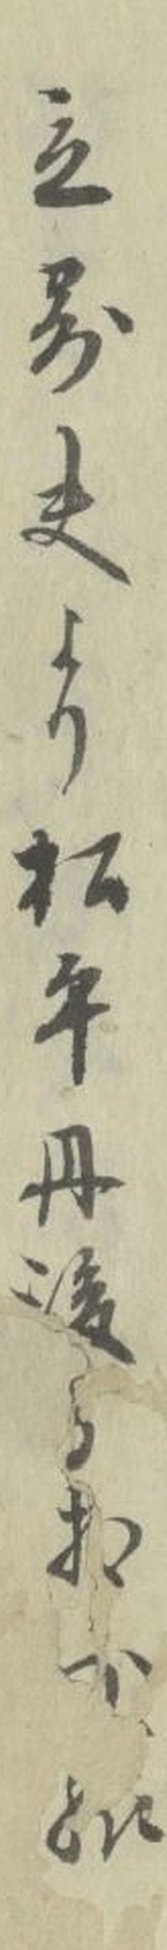立寄夫より松平丹後守相脇

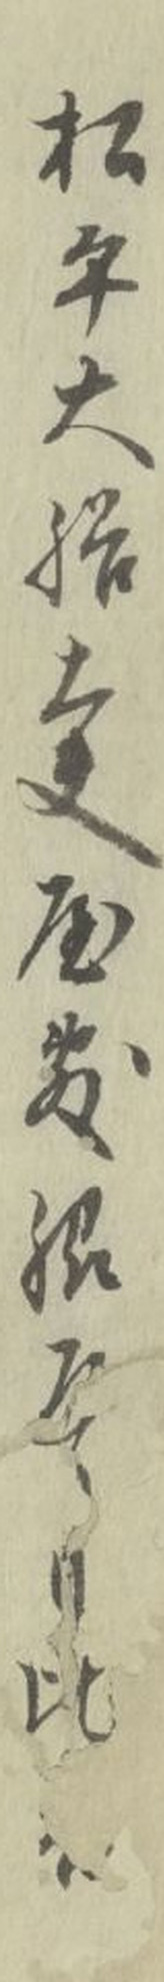松平大膳大夫屋敷脇通り日比谷
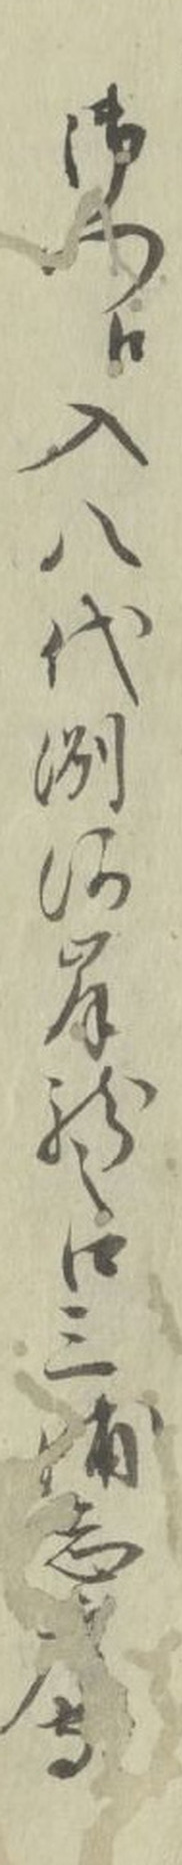御門え入八代洲河岸龍之口三浦志摩守
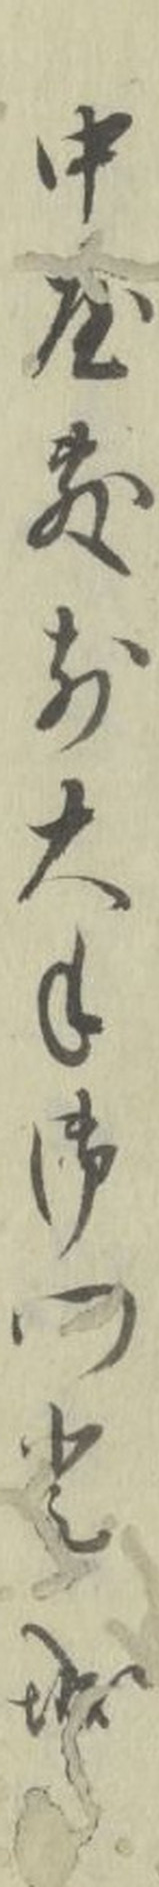中屋敷前大手御門登城
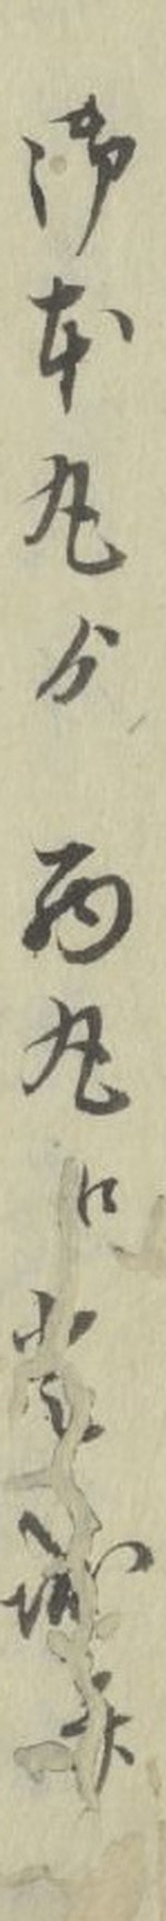御本丸ゟ西丸え登城幷
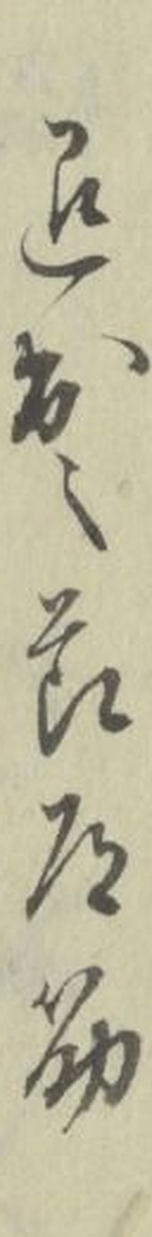退出之道筋
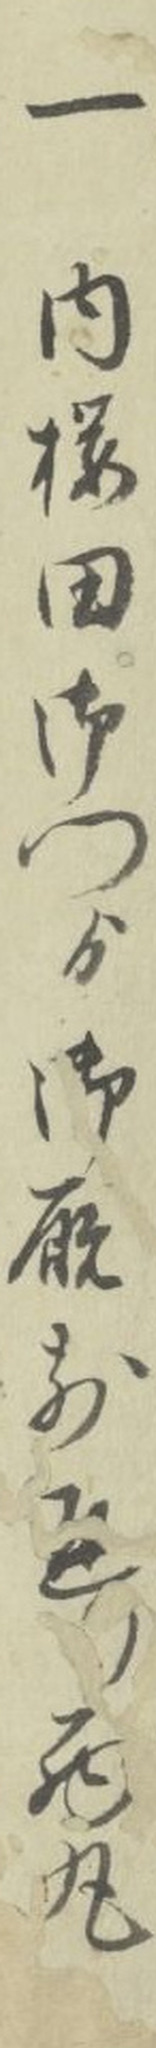一内桜田御門ゟ御厩前通り西丸
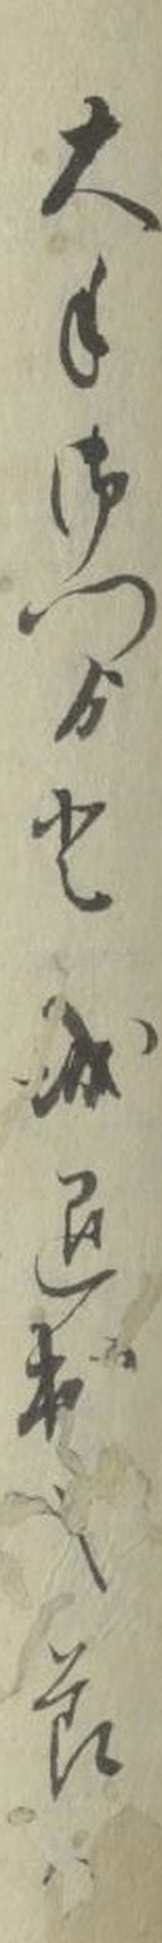大手御門ゟ登城退出之節は
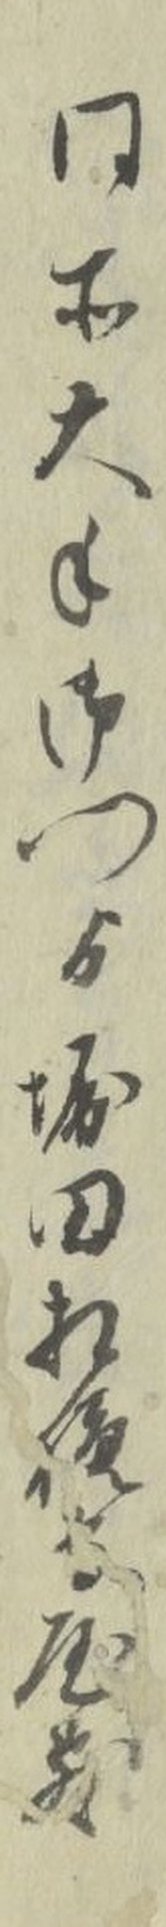同所大手御門ゟ堀田相模守屋敷
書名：琉球来朝記 自一至七
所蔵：University of the Ryukyus Library
